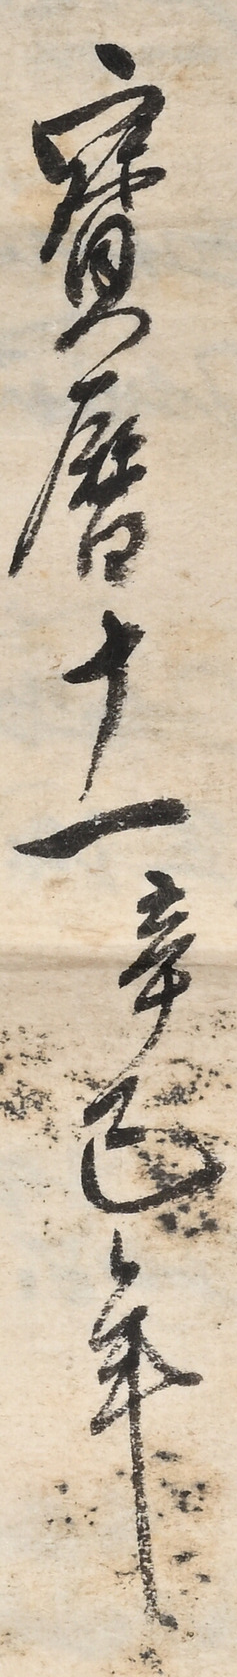宝暦十一辛巳年
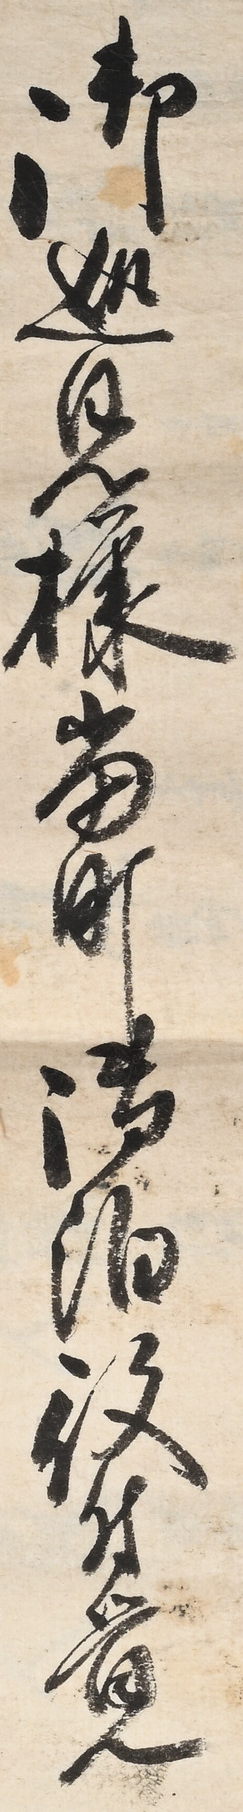御巡見様当町御泊役付覚
